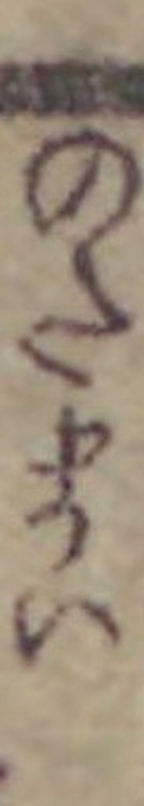のたまい
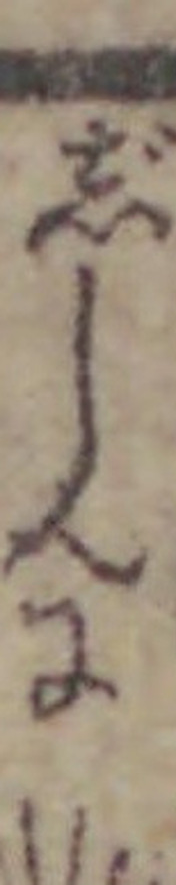じしんに
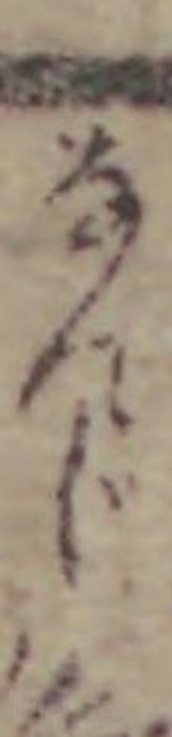なんじ
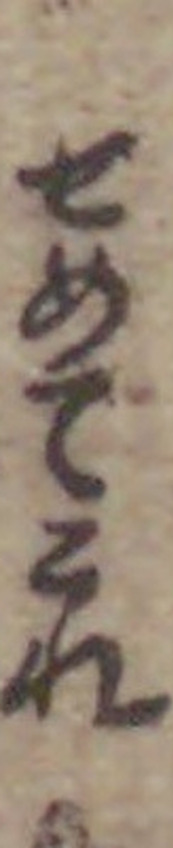せめてこれ
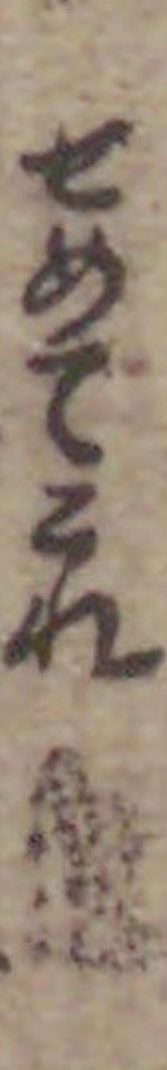せめてこれ
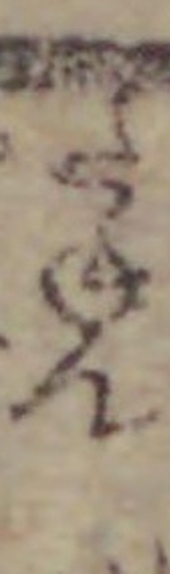たねん
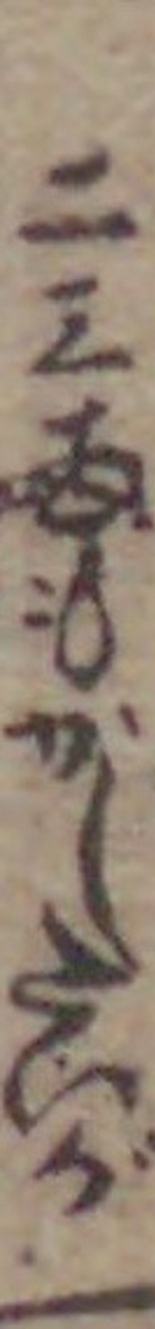二三両もかしたいが
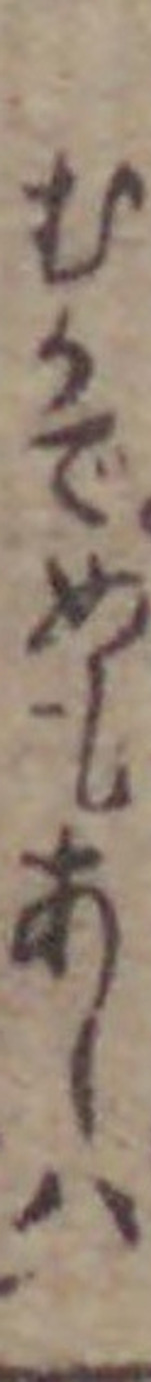むかでめもあしは
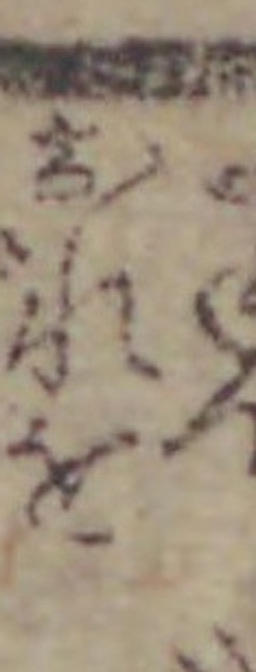おれを
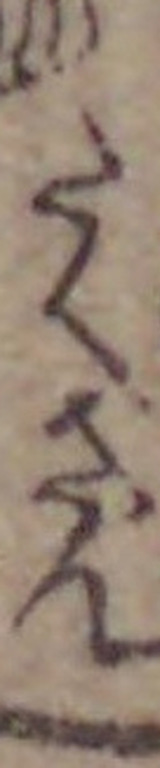たくさん
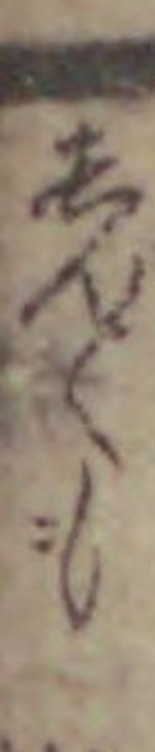しん〴〵も
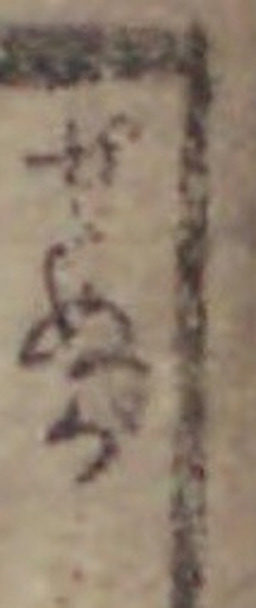せぬが
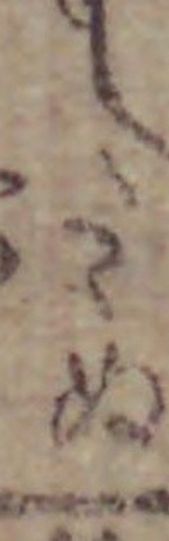たゝぬ
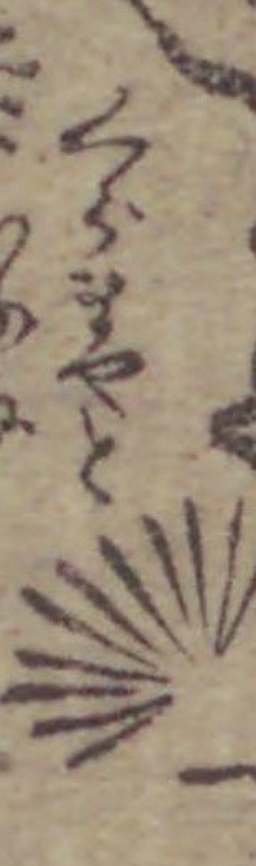くらまやと
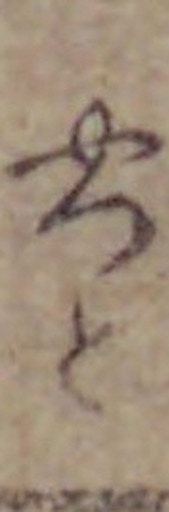やつと
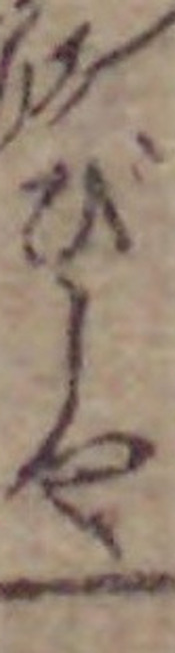びしや
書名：御代の御寶
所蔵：国立国会図書館 National Diet Library, JAPAN
